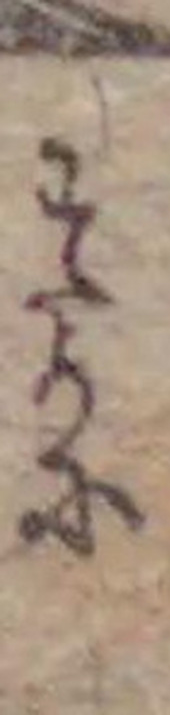わたりに
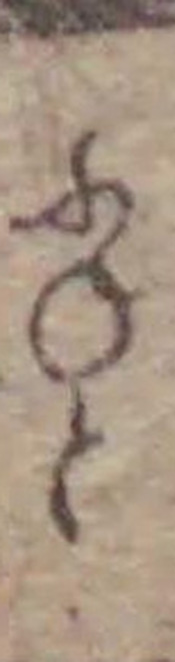ふねと
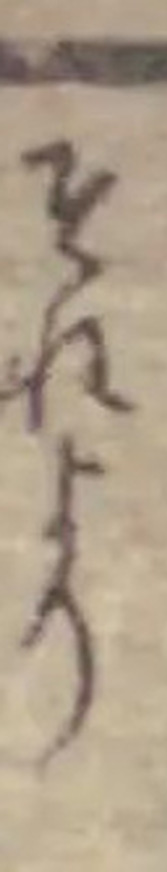それより
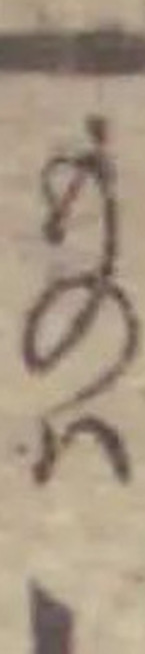ものは
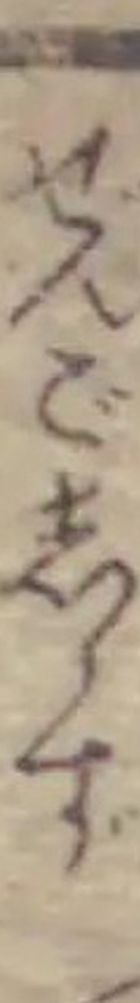せんごしらず
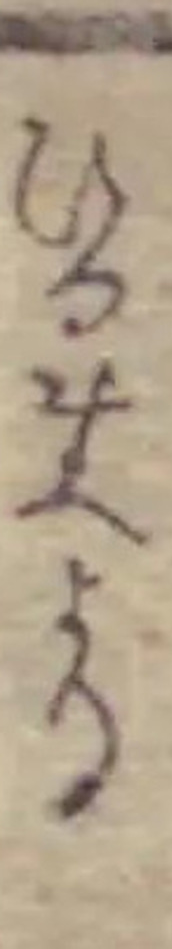ひるまへより
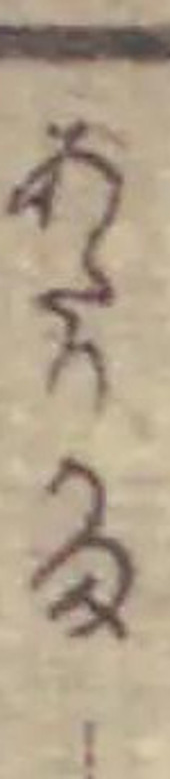あたりかま
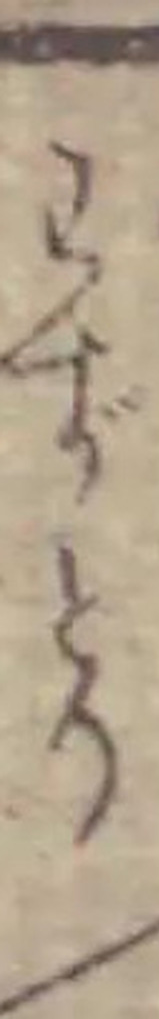わずとり
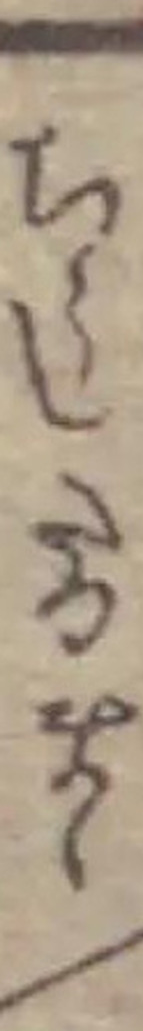ちらしたるまゝ
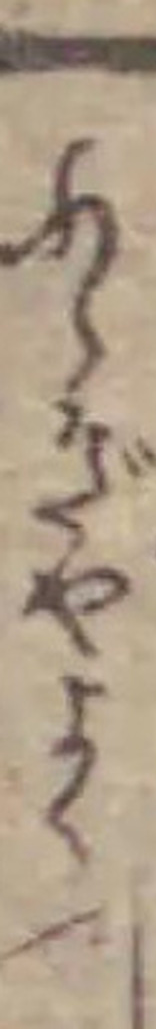ふしぎやよく
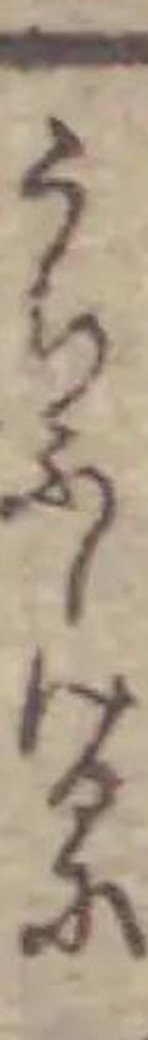うちふしけるに
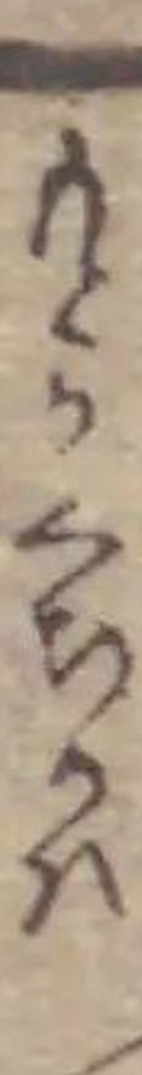もとかくちかは
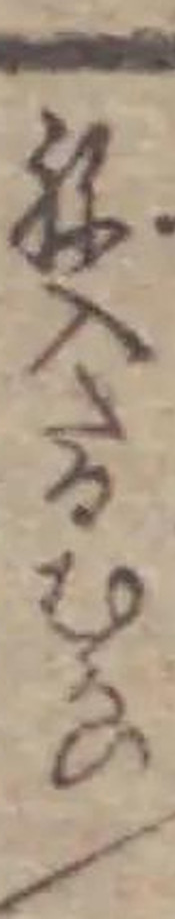ね入たるむな
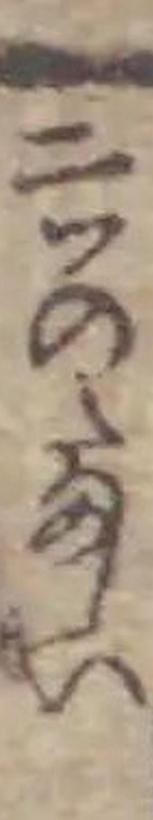二つのたましい
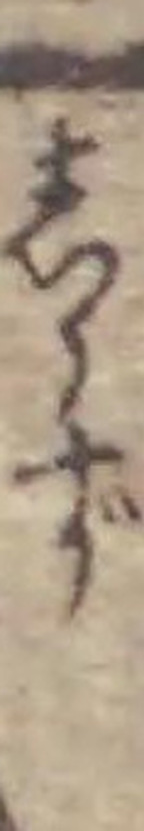しらず
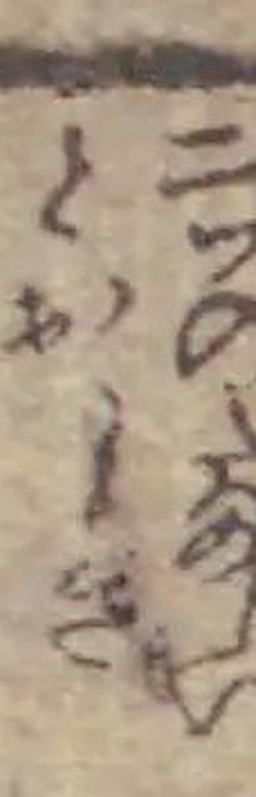とおしき
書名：飛た間違矢口噂 2巻
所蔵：国立国会図書館 National Diet Library, JAPAN
